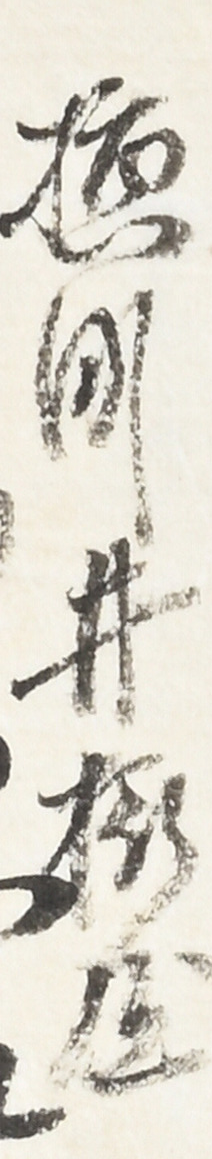横町井桁屋
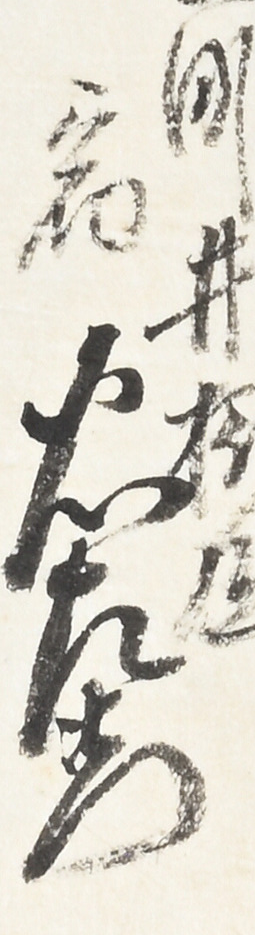宿忠左衛門
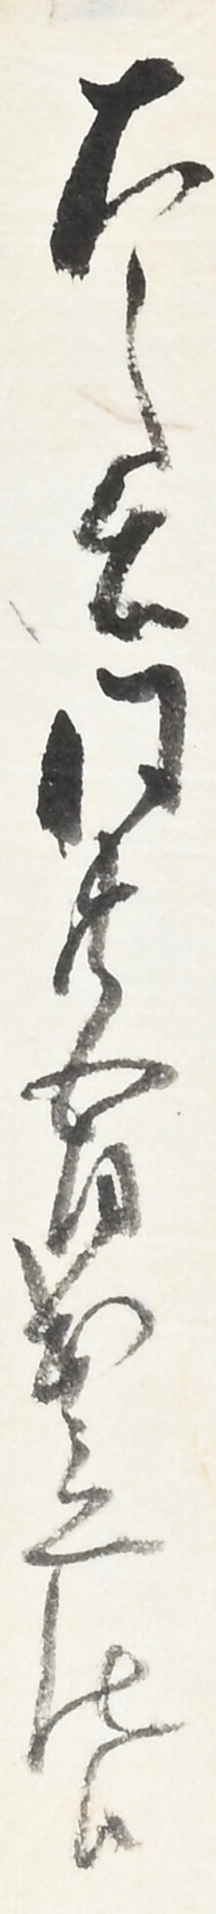右之者同廿五日出立仕候
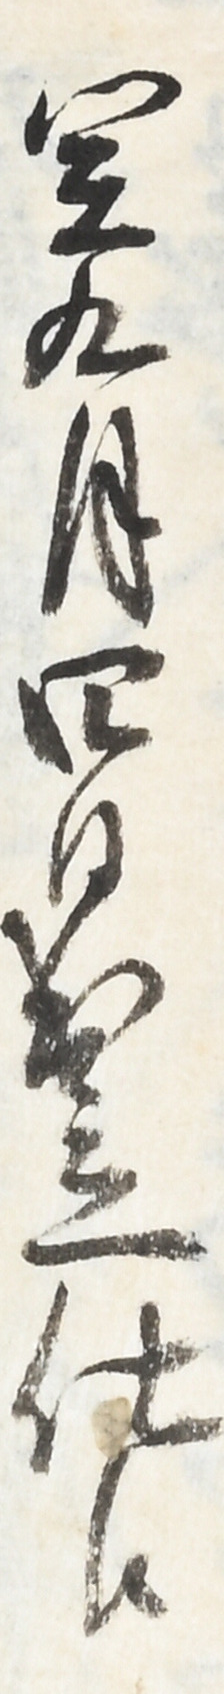右之者同四日出立仕候

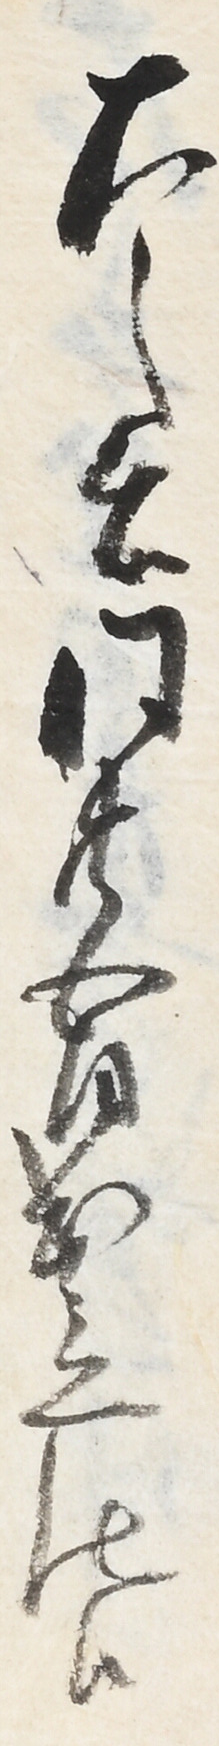右之者閏九月四日出立仕候
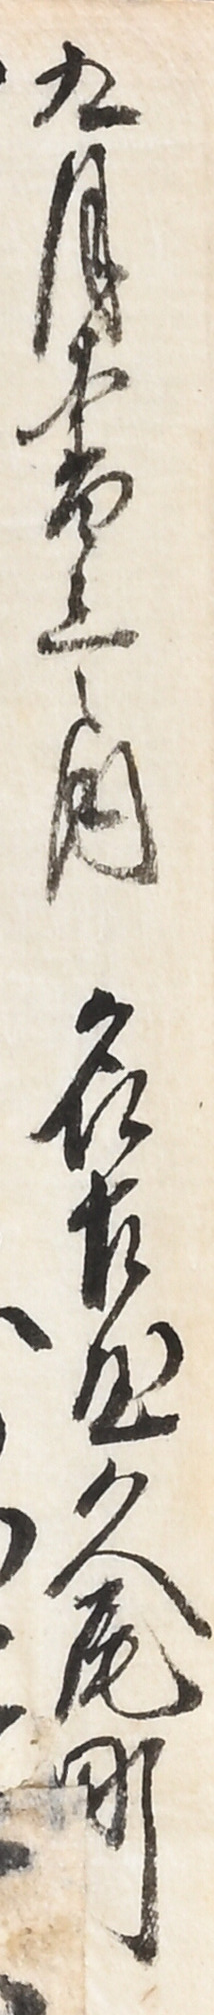九月書上之内名古屋久尾町
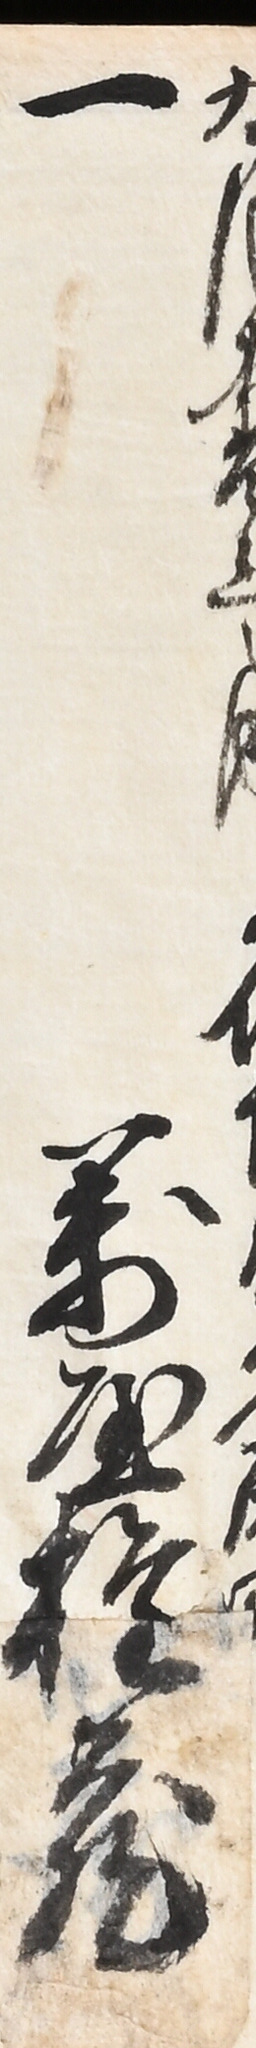一万屋権蔵
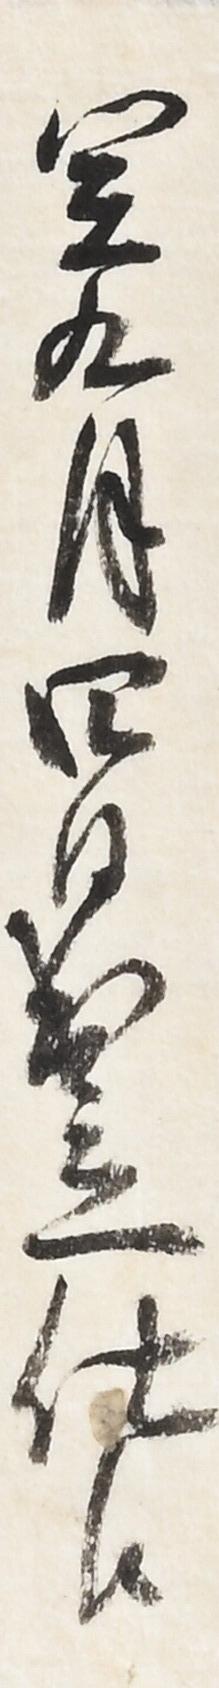閏九月四日出立仕候
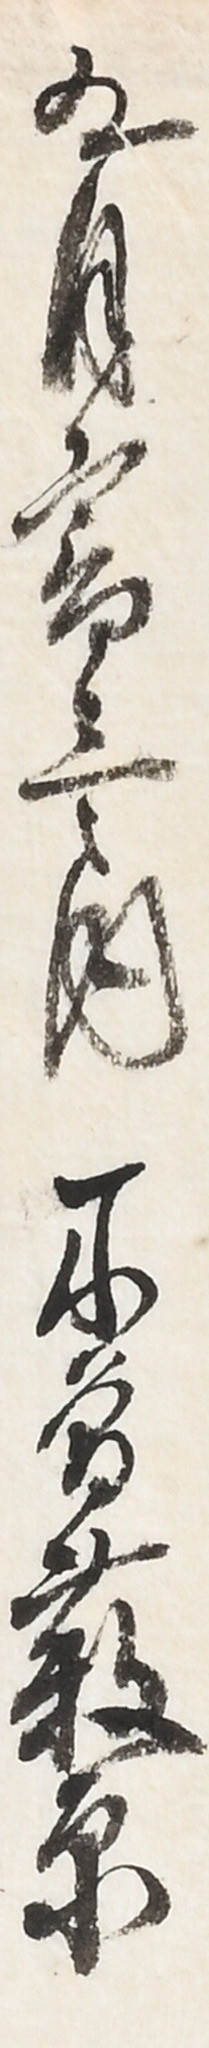九月書上之内木曽藪原
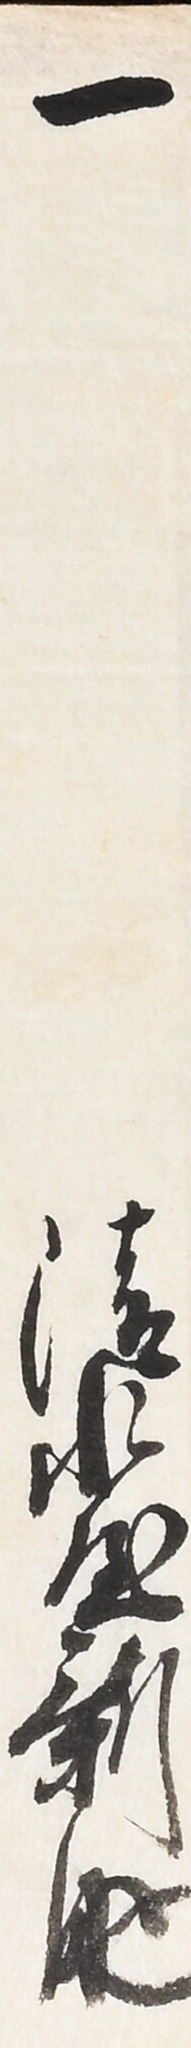一清水屋新助
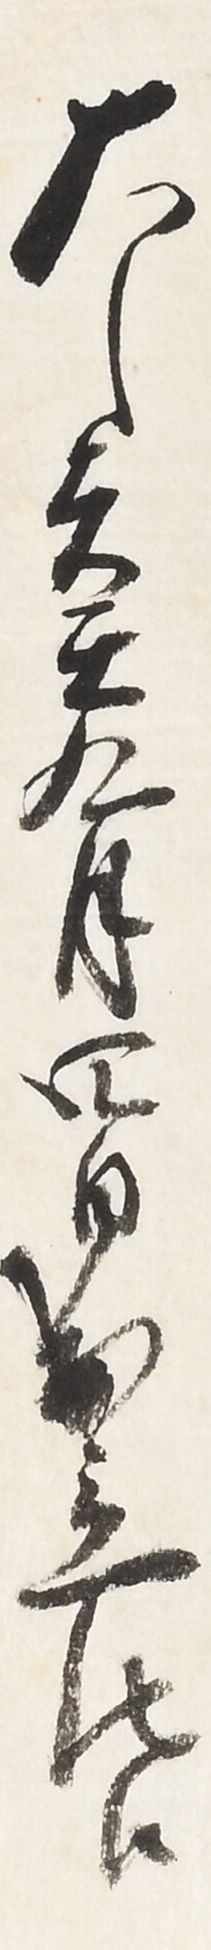右之者閏九月四日出立仕候
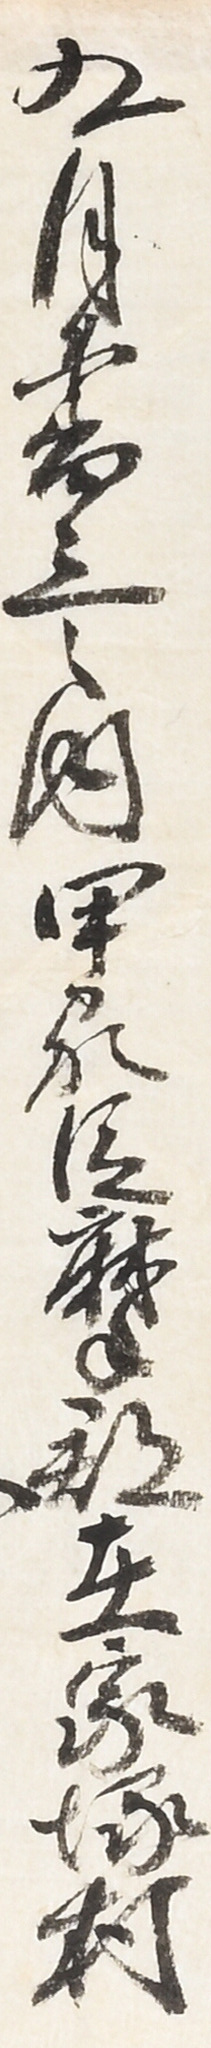九月書上之内甲州巨摩郡在家塚村
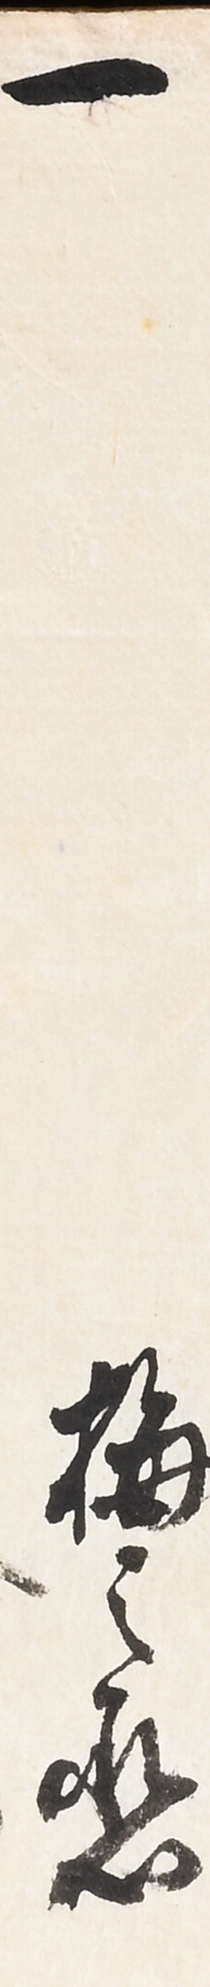一梅之丞
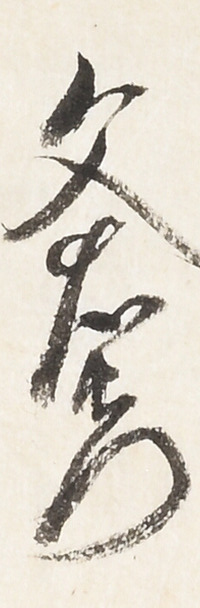文右衛門
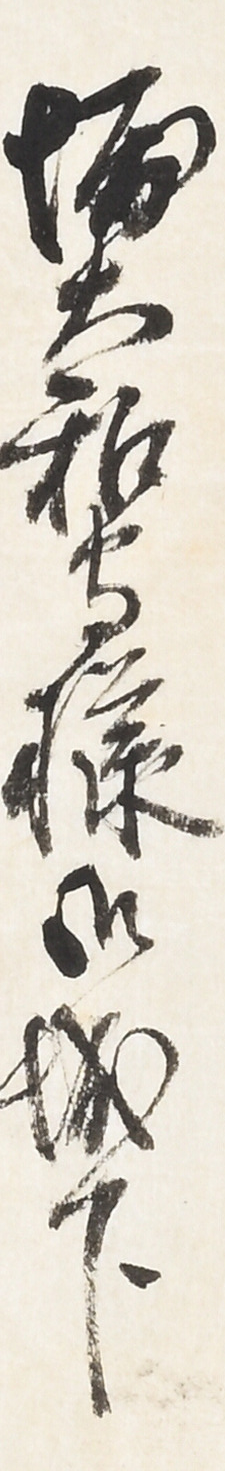堀大和守様御城下
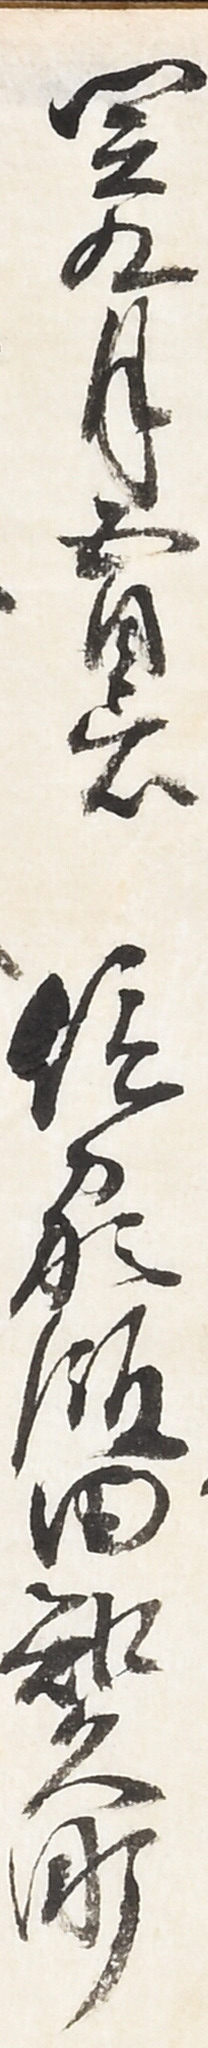閏九月五日着信州飯田知久町
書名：旅人泊控帳
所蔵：伊那市立高遠町図書館・合同会社AMANE
